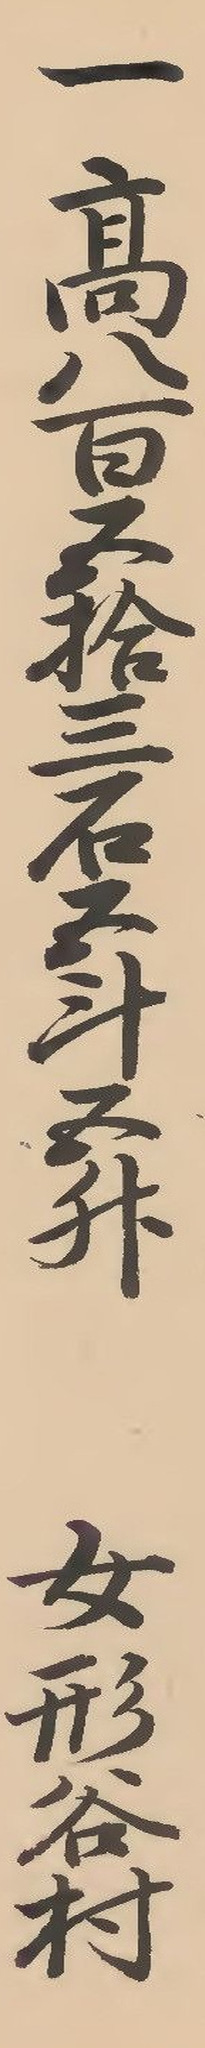一高八百五拾三石五斗五升女形谷村
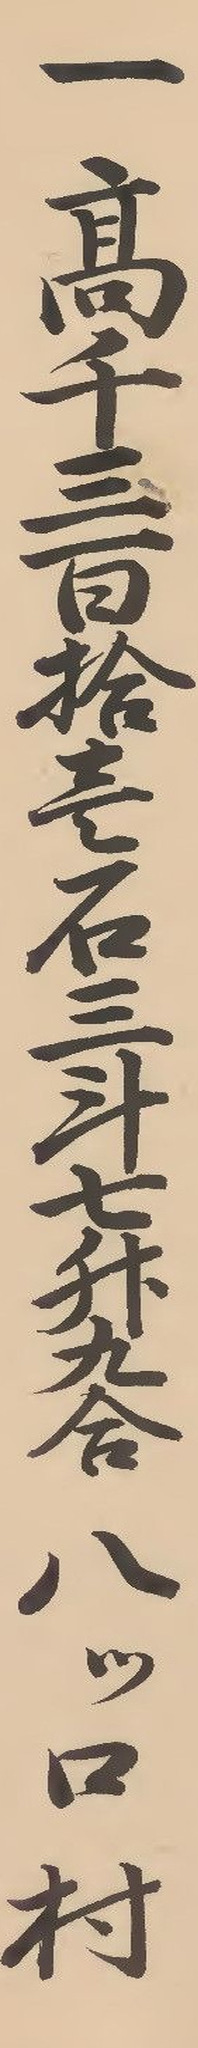一高千三百拾壱石三斗七升九合八ツ口村
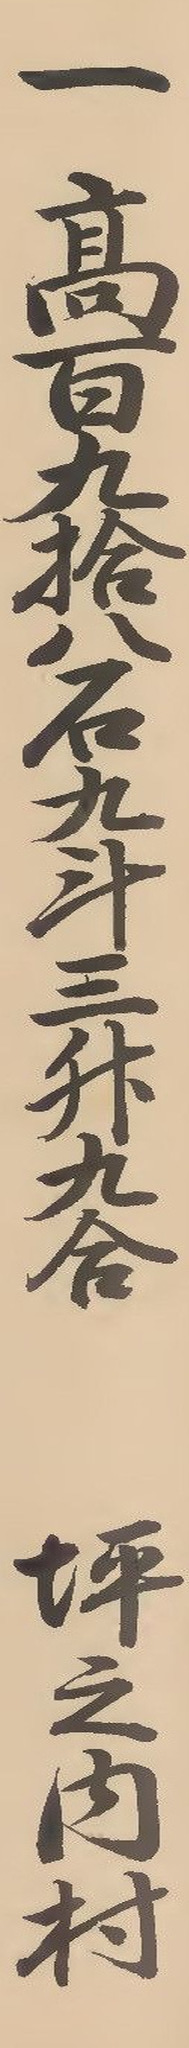一高百九拾八石九斗三升九合坪之内村
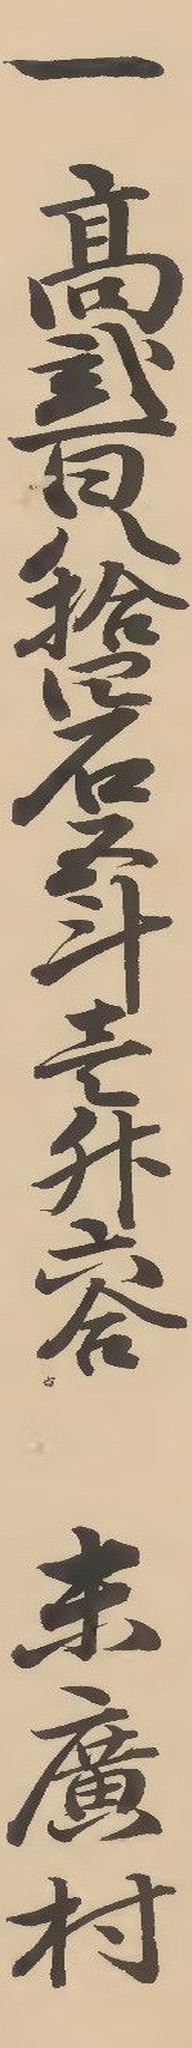一高弐百八拾四石五斗壱升六合末広村
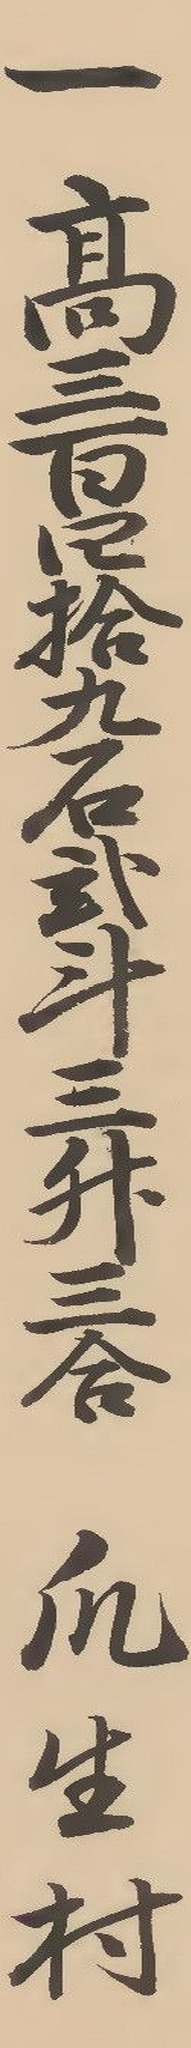一高三百四拾九石弐斗三升三合爪生村
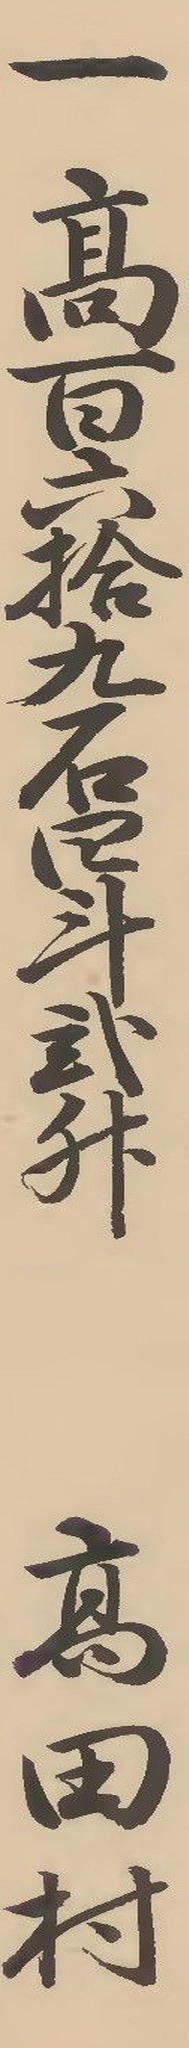一高百六拾九石四斗弐升高田村

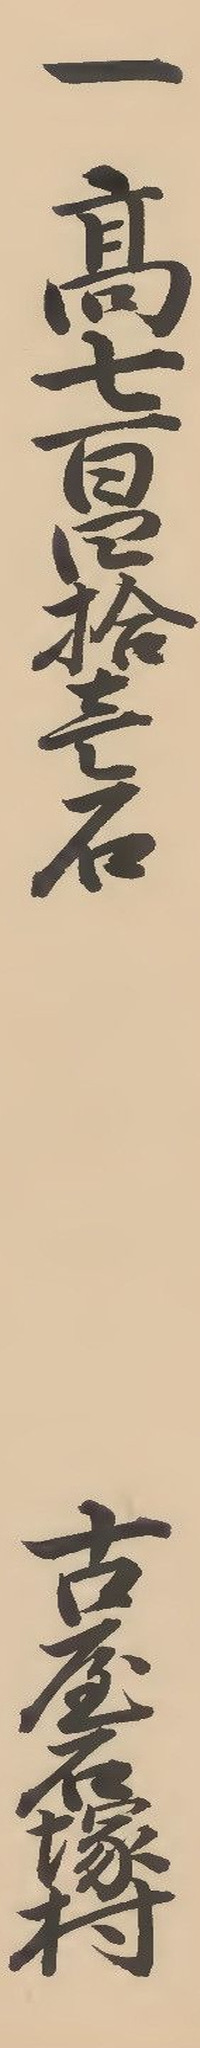一高七百四拾壱石古屋石塚村
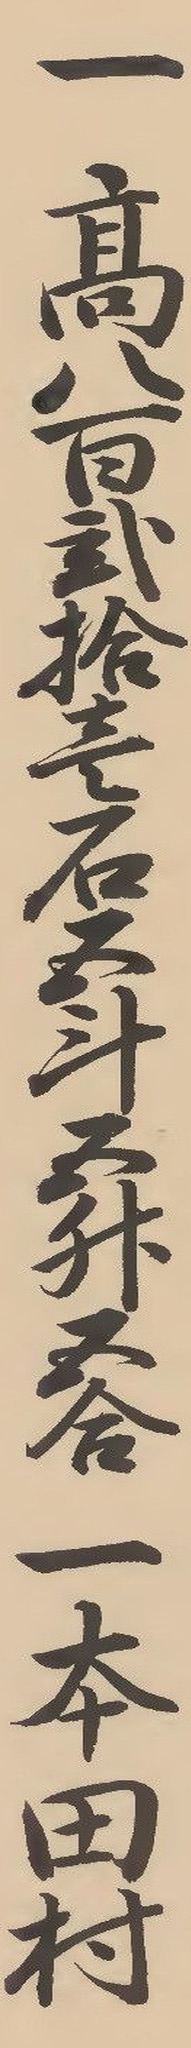一高八百弐拾壱石五斗五升五合一本田村
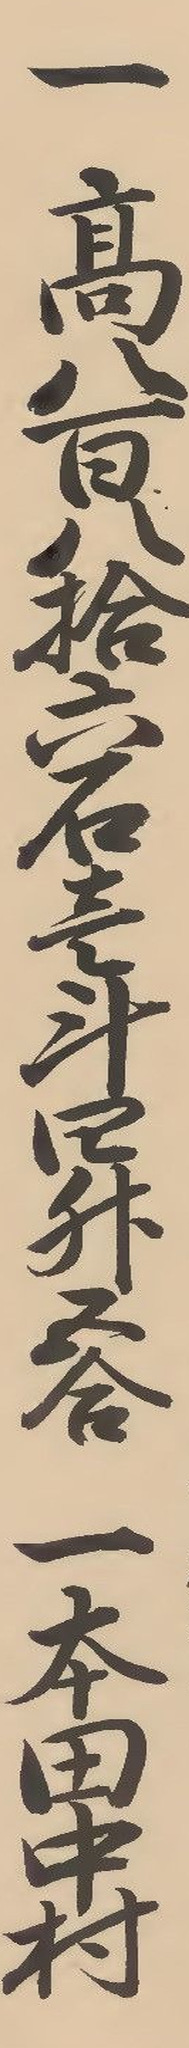一高八百弐拾壱石五斗五升五合一本田村
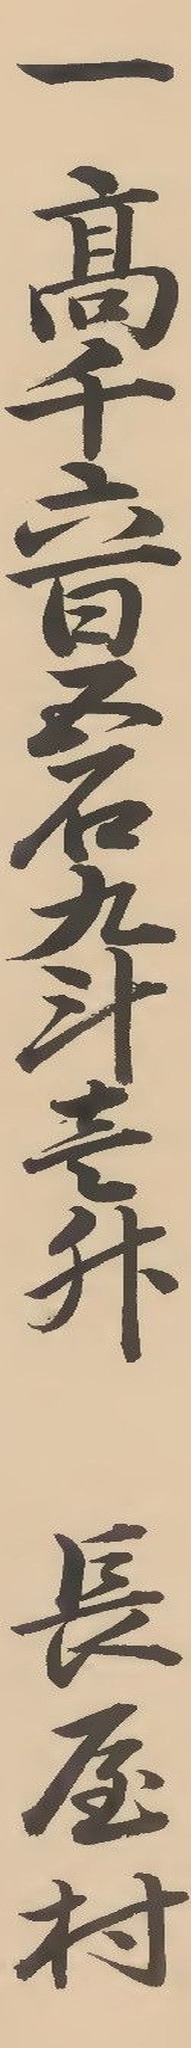一高千六百五石九斗壱升長屋村
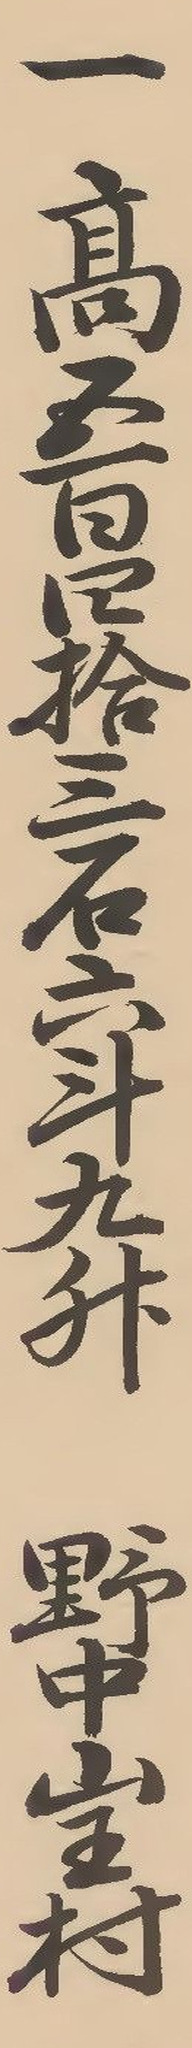一高五百四拾三石六斗九升野中山王村
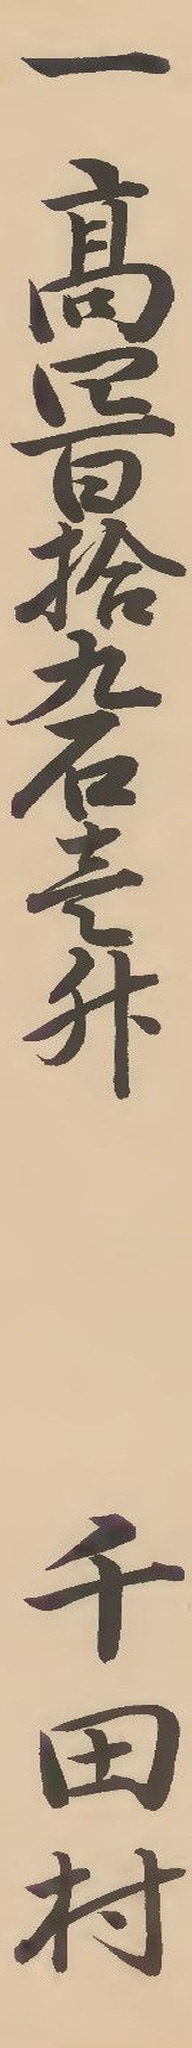一高四百拾九石壱升千田村

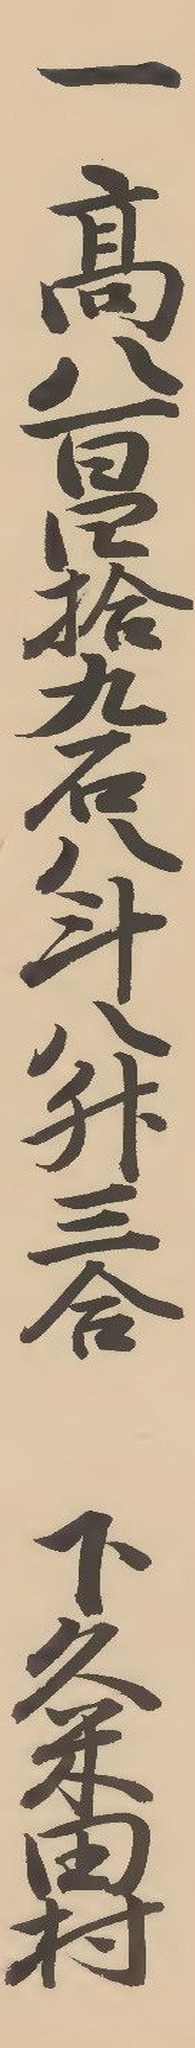一高八百四拾九石八斗八升三合下久米田村
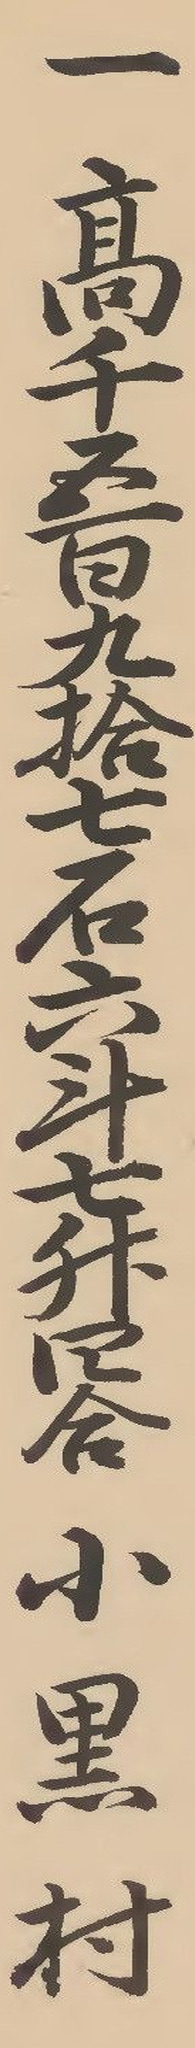一高千五百九拾七石六斗七升四合小黒村
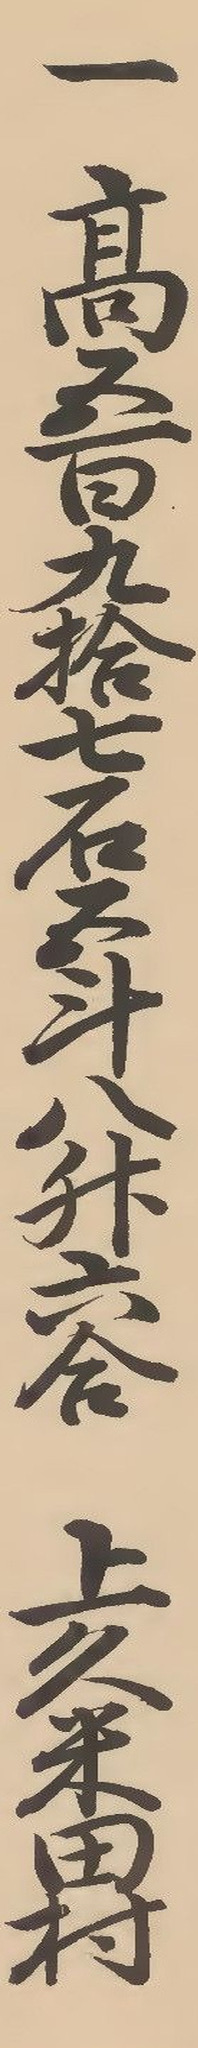一高五百九拾七石五斗八升六合上久米田村
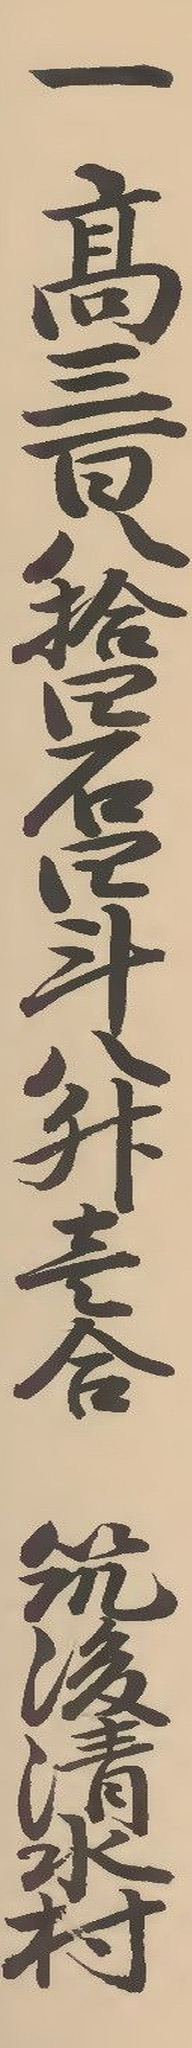一高三百八拾四石四斗八升壱合筑後清水村
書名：越前国郷帳
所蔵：国立公文書館 National Archives of Japan
